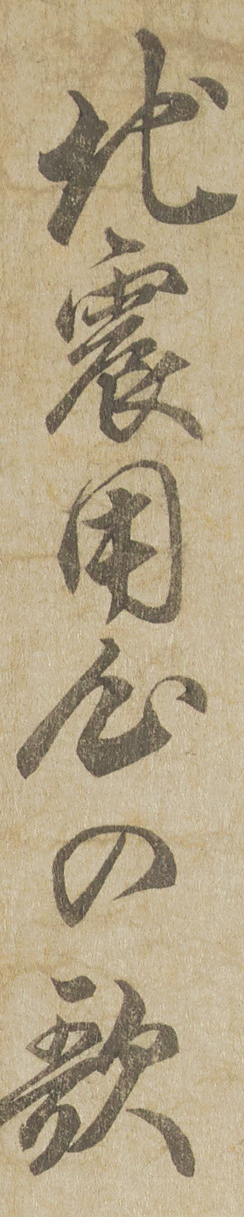地震用心の歌
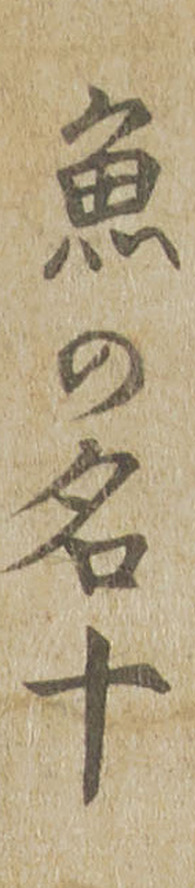魚の名十
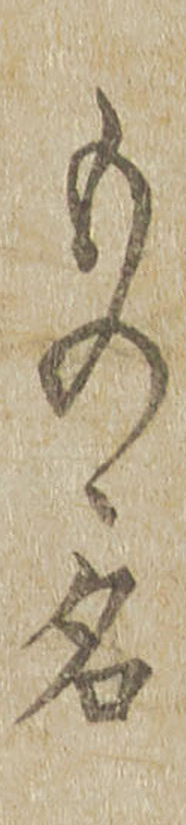ものゝ名
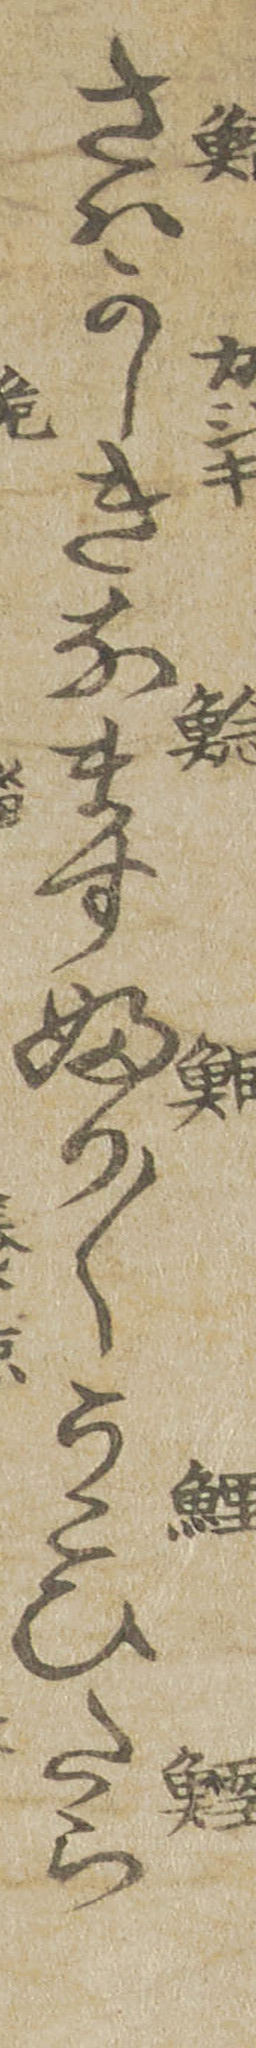さはかしきなますふり〳〵うこひたら
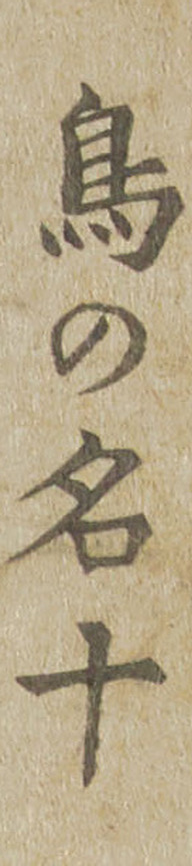鳥の名十
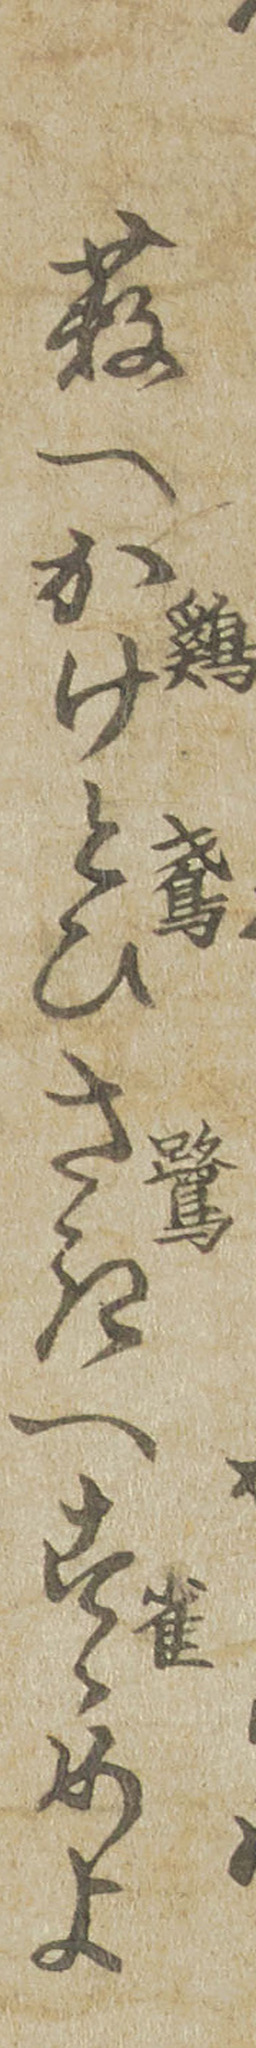藪へかけとひさきへすゝめよ
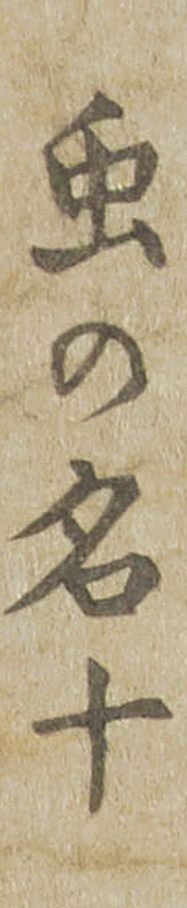虫の名十
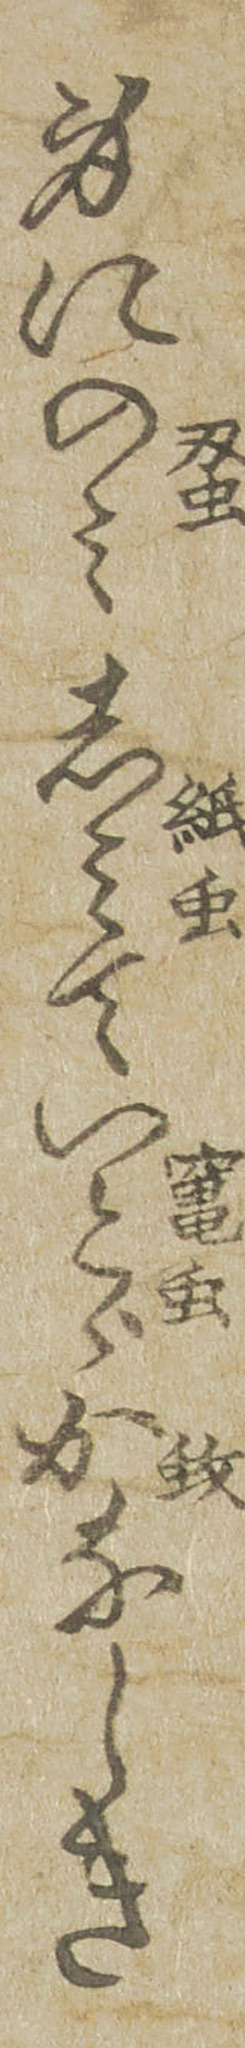身にのみしみていとゞかなしき
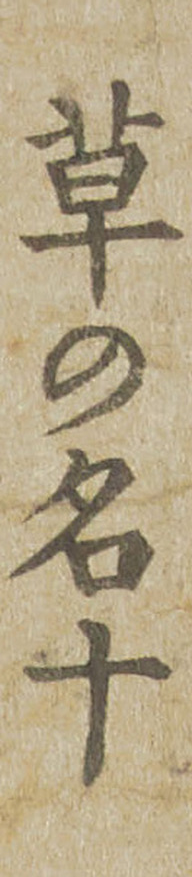草の名十
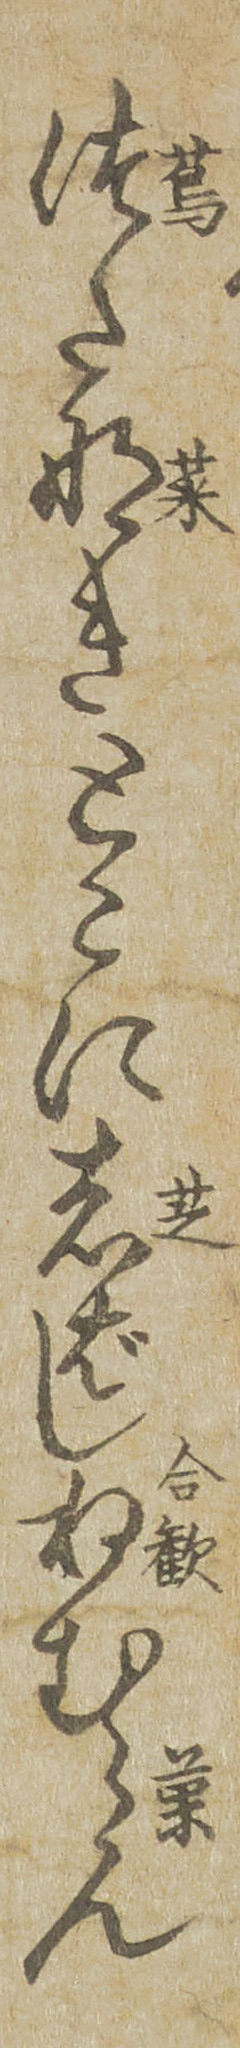つたなきとこにしばしねむらん
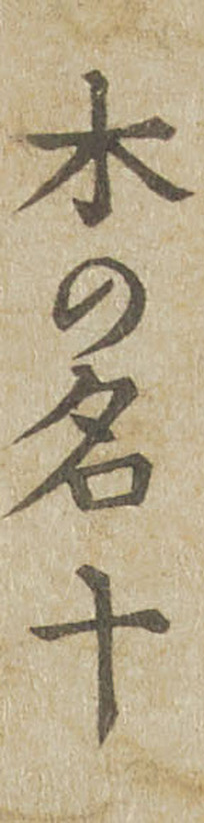木の名十
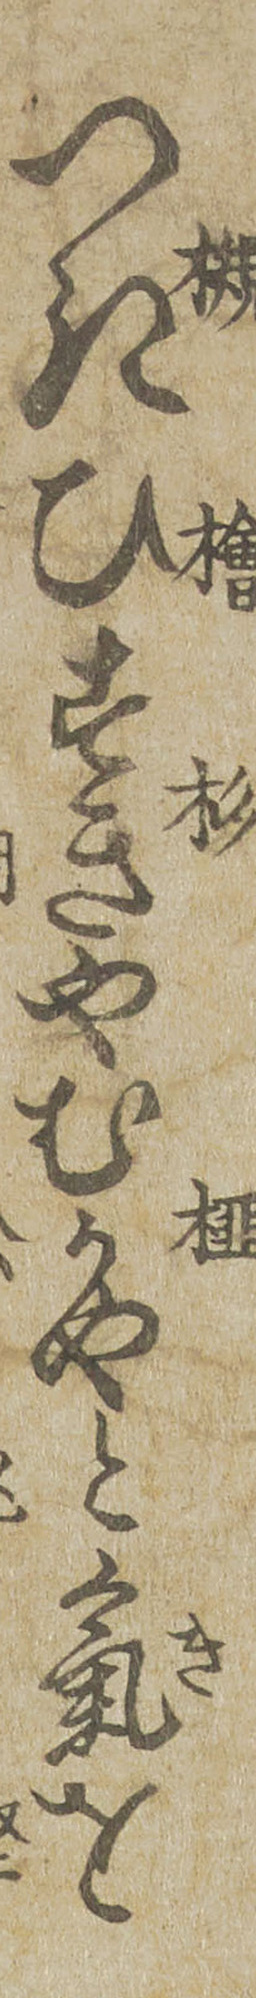つきひすきやむかやと気を
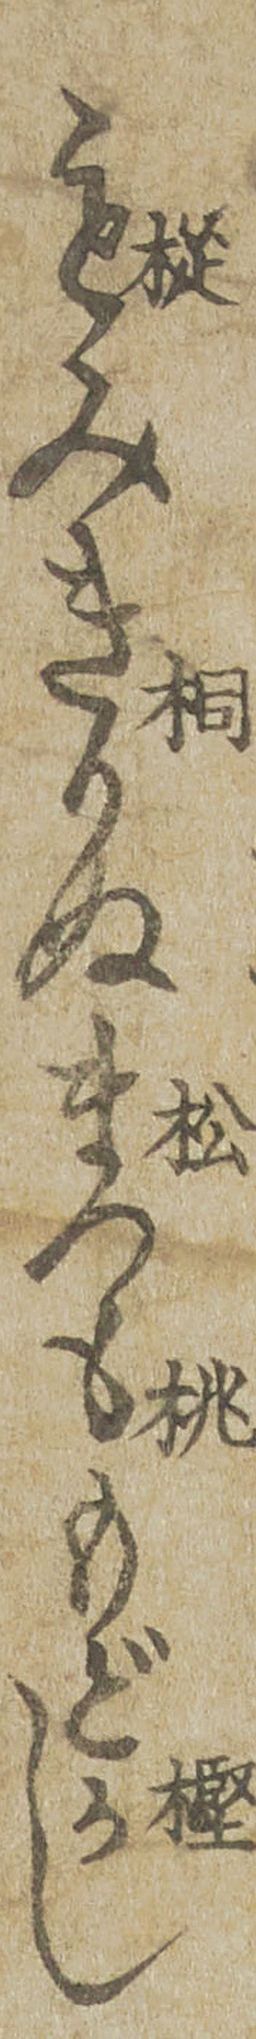もみきりぬまつももどかし
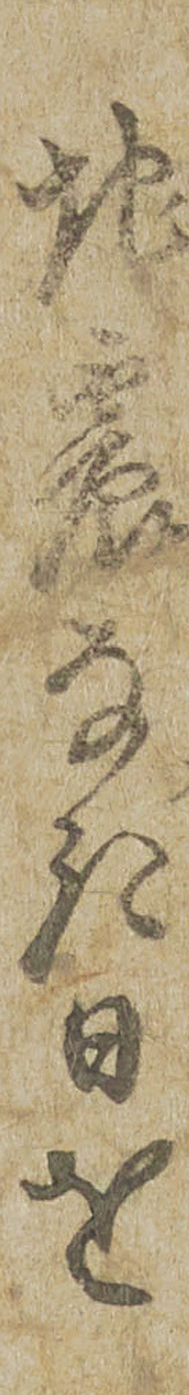地震なき日を
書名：地震用心の歌
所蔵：東京大学総合図書館 General Library in the University of Tokyo, JAPAN
